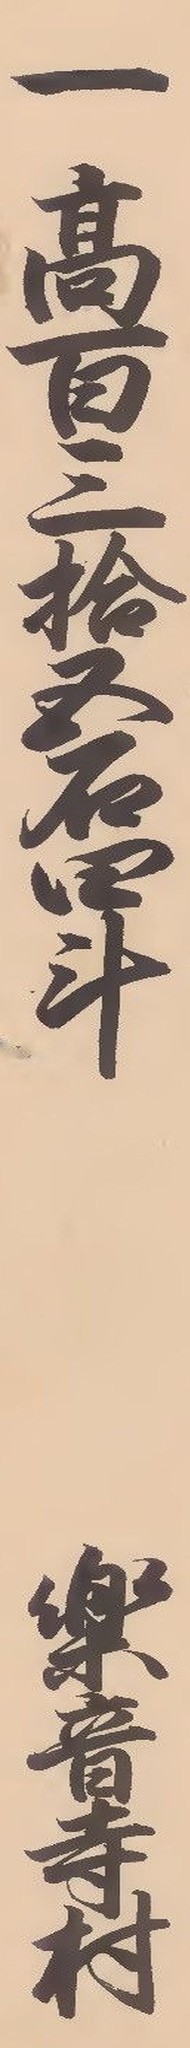一高百三拾五石四斗楽音寺村

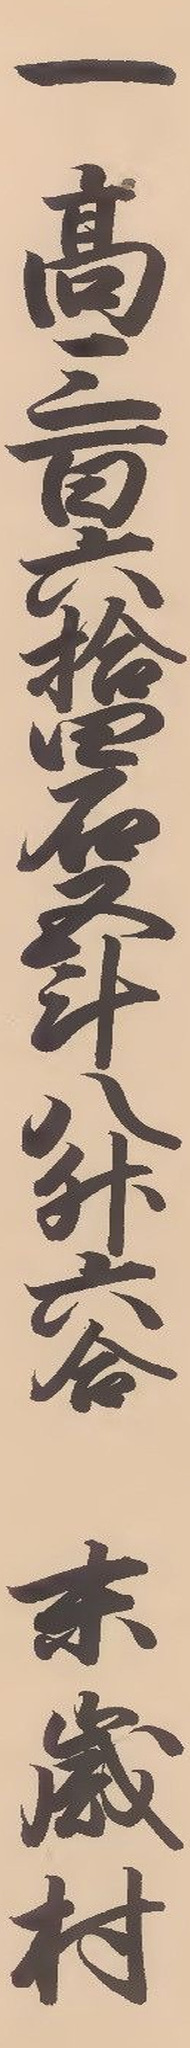一高三百六拾四石五斗八升六合末歳村
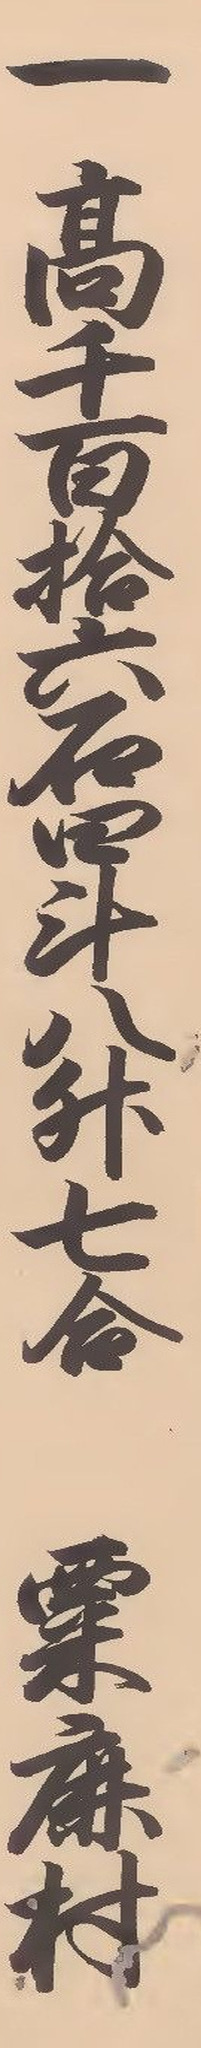一高千百拾六石四斗八升七合粟鹿村
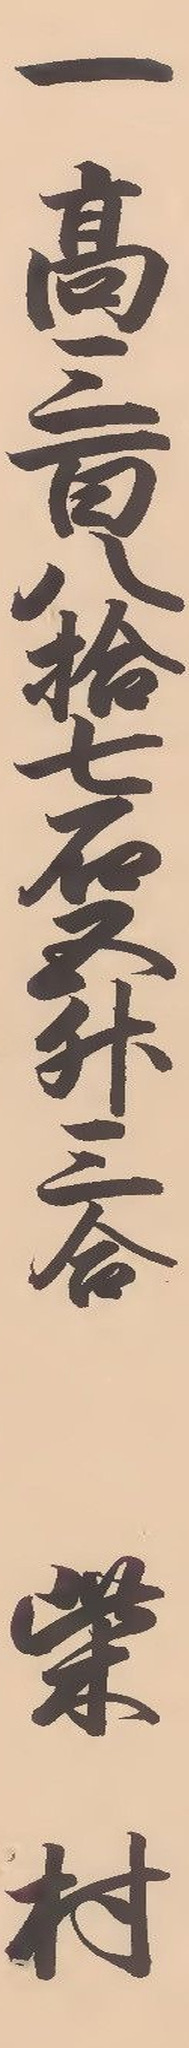一高三百八拾七石五升三合柴村
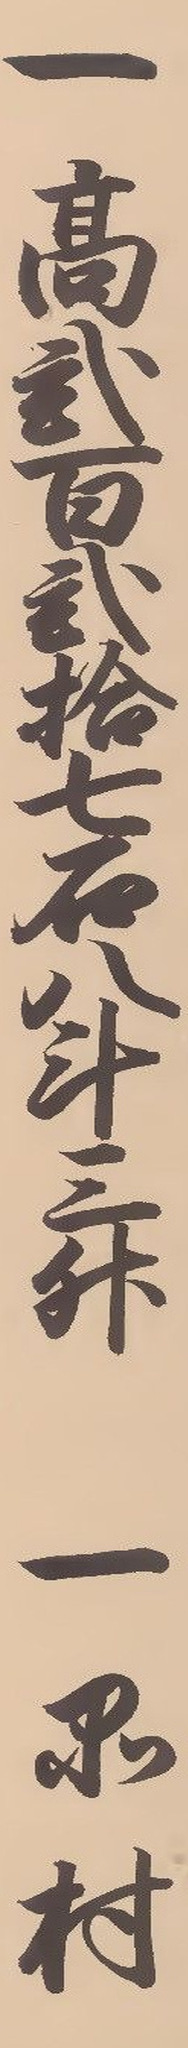一高弐百弐拾七石八斗三升一品村
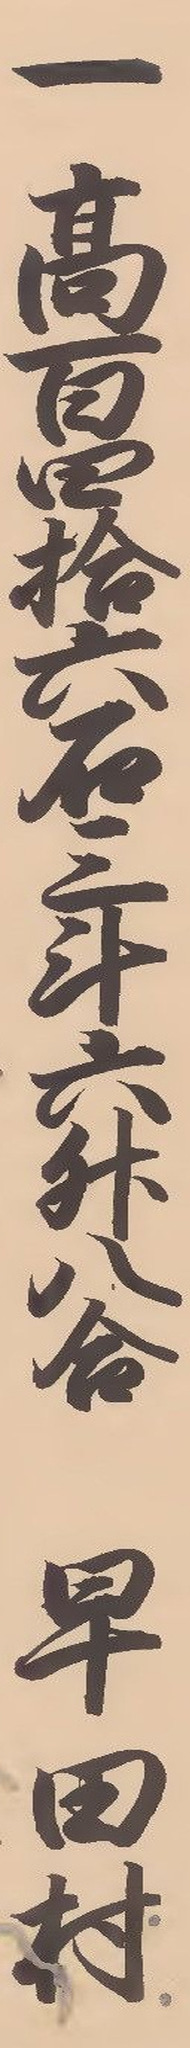一高百四拾六石三斗六升八合早田村
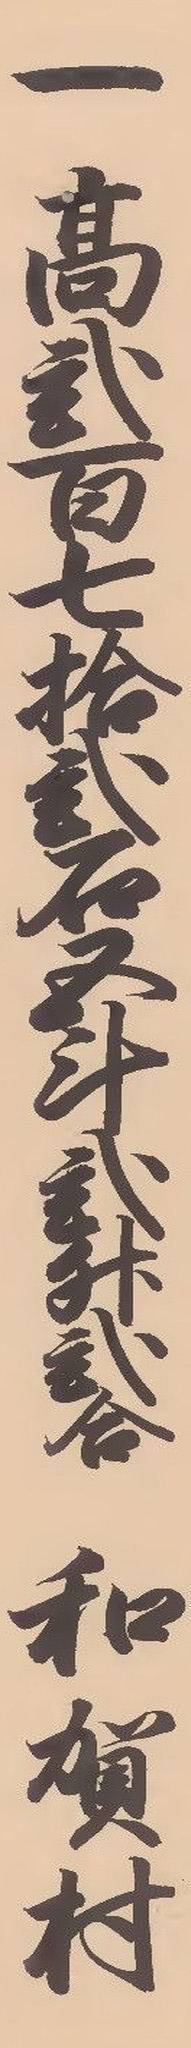一高弐百七拾弐石五斗弐升弐合和賀村
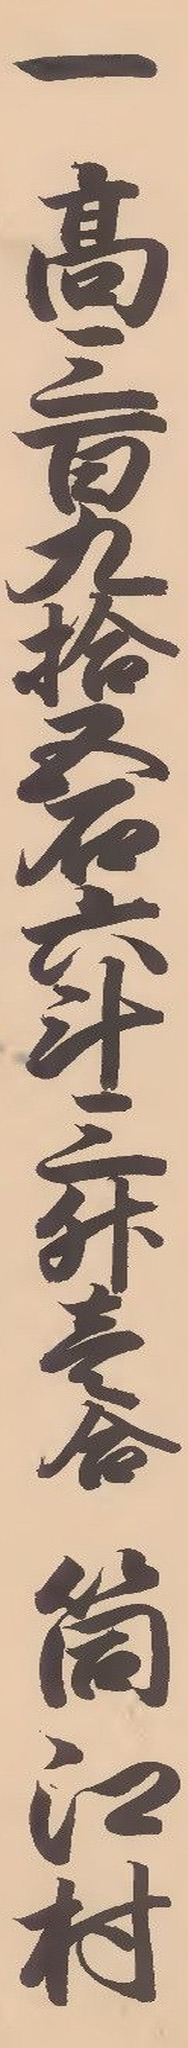一高三百九拾五石六斗三升壱合筒江村

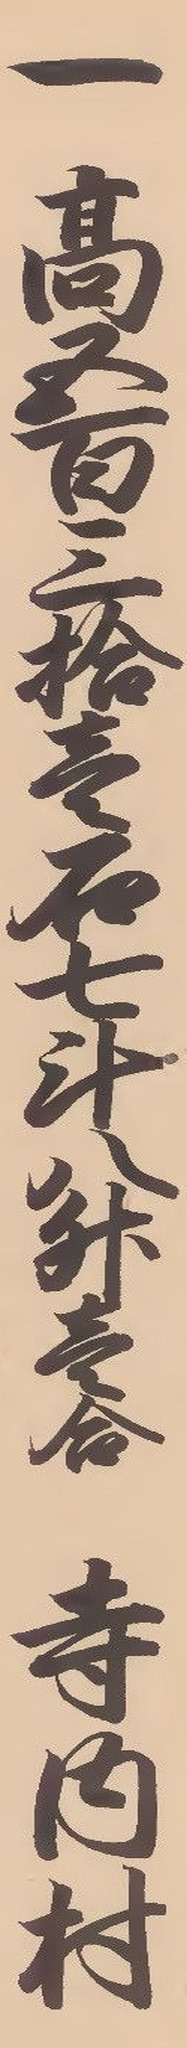一高五百三拾壱石七斗八升壱合寺内村
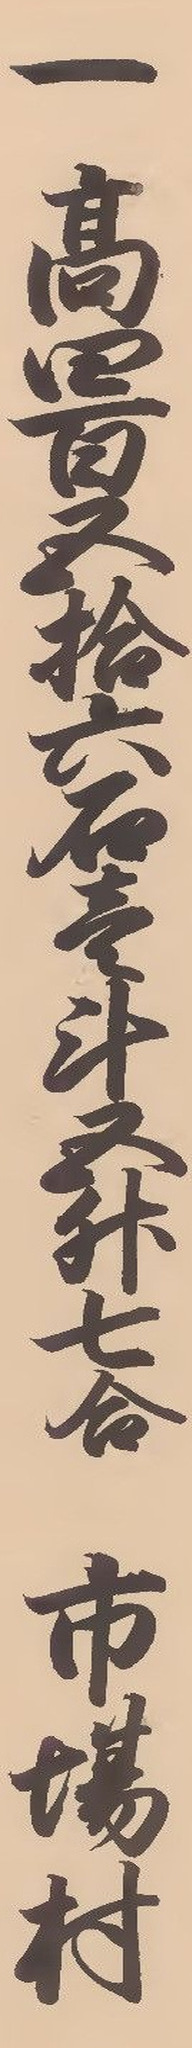一高四百五拾六石壱斗五升七合市場村
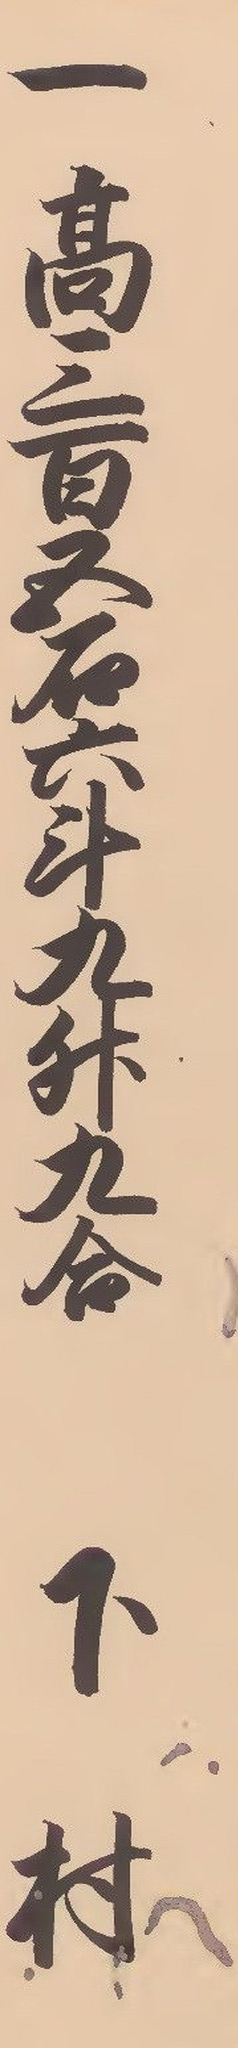一高三百五石六斗九升九合下村
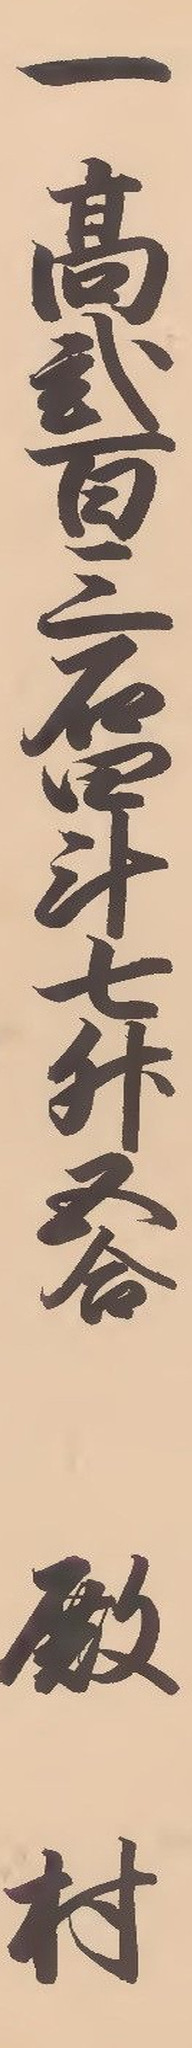一高弐百三石四斗七升五合殿村
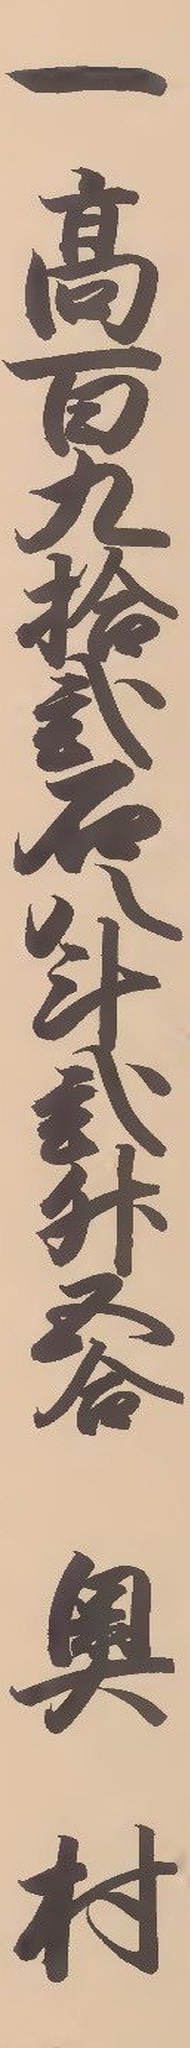一高百九拾弐石八斗弐升五合奥村
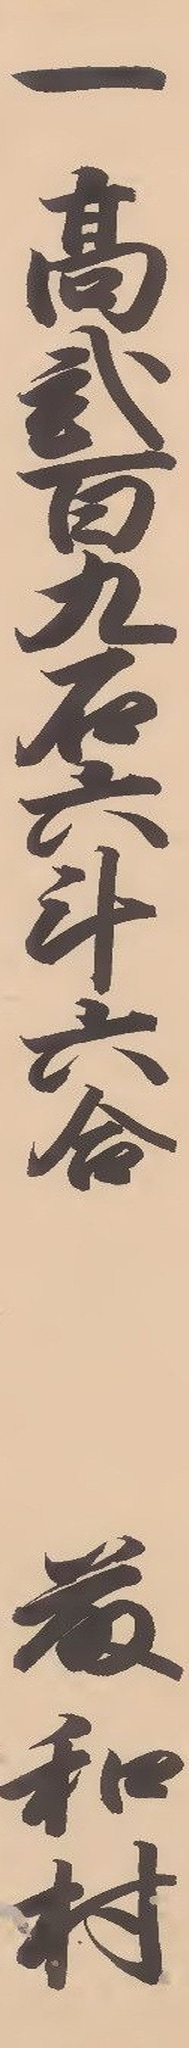一高弐百九石六斗六合藤和村
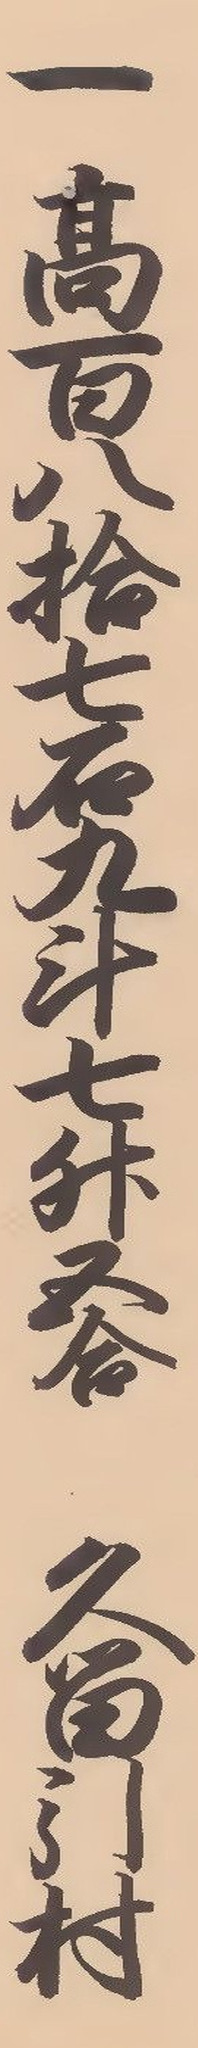一高百八拾七石九斗七升五合久留引村
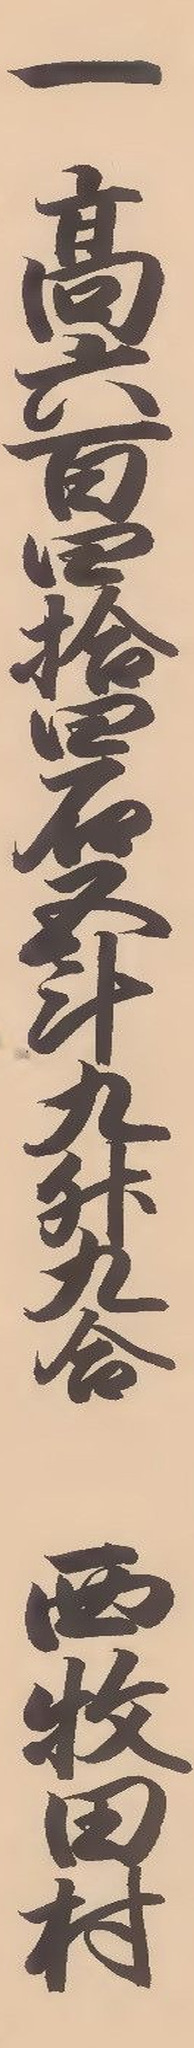一高六百四拾四石五斗九升九合西牧田村
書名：但馬国郷帳
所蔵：国立公文書館 National Archives of Japan
